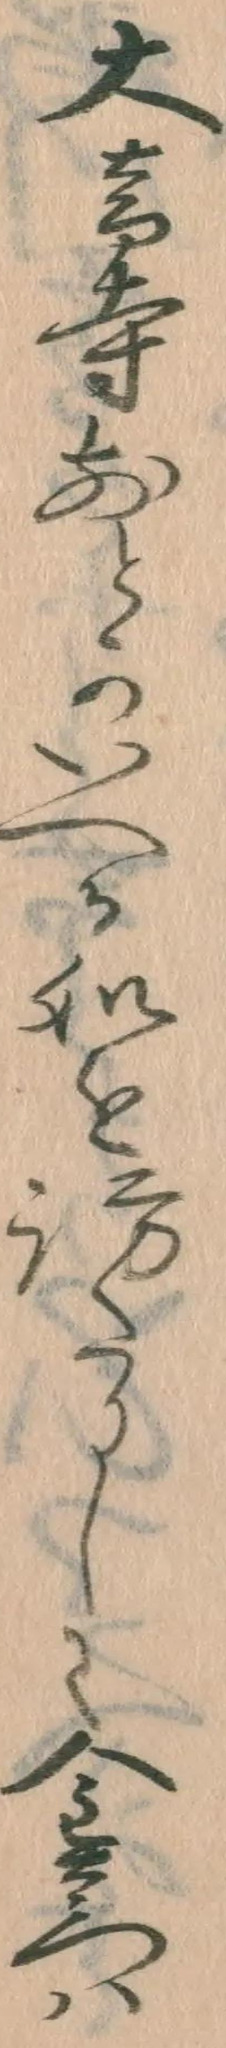大音寺前とかいへる処を訪たりしに金右衛門ハ
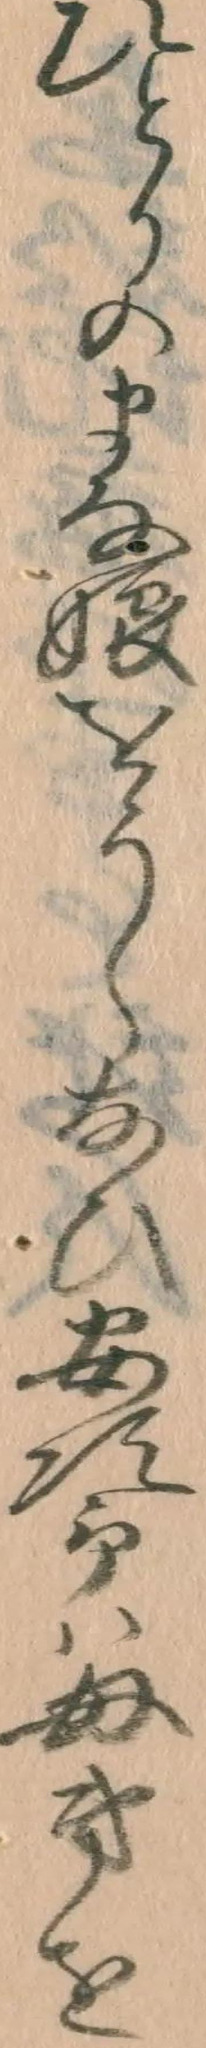ひとりのまな娘をうしなひ安次郎ハ母弟を
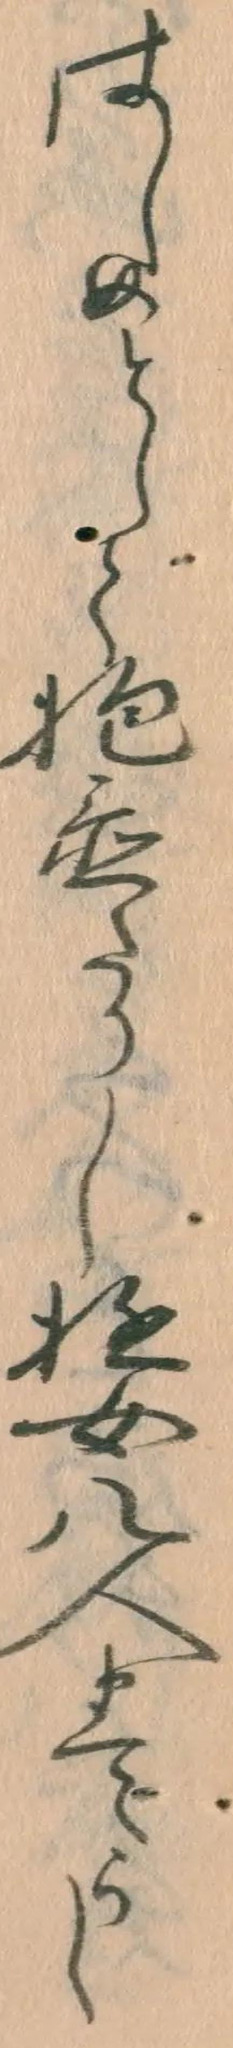はしめとして抱置たりし遊女八人まてうし
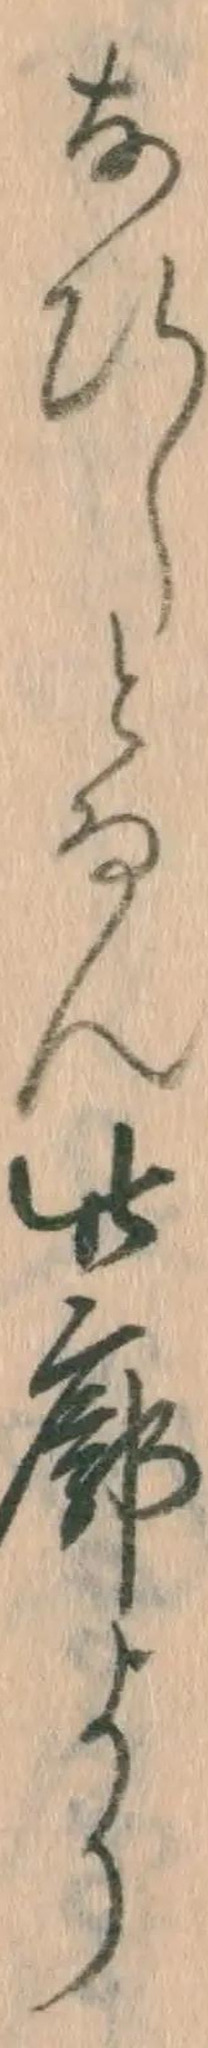なひしとなん此廓より
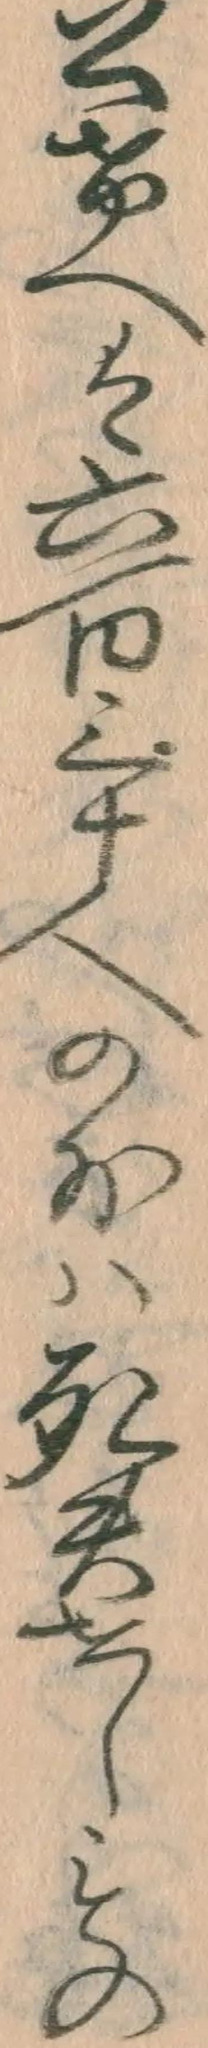公けへは六百三十人の外ハ死失せしもの
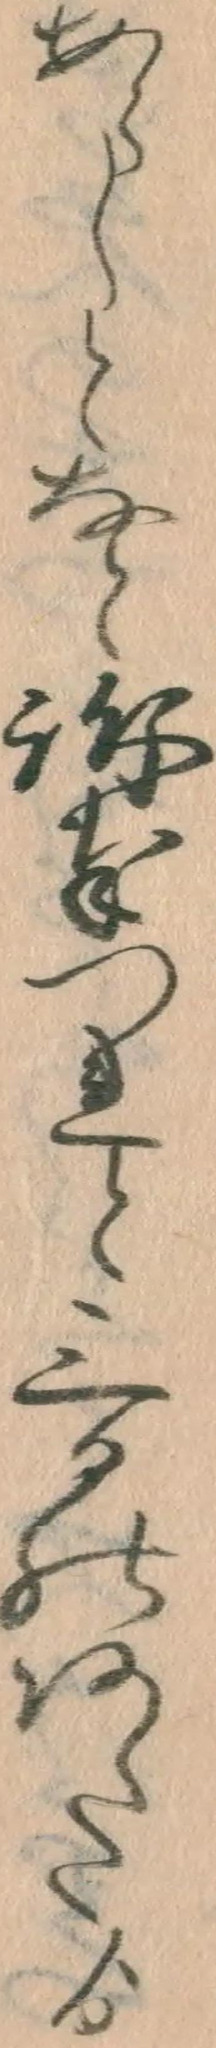ありしとなと訴奉つれと三日のあしたゟ
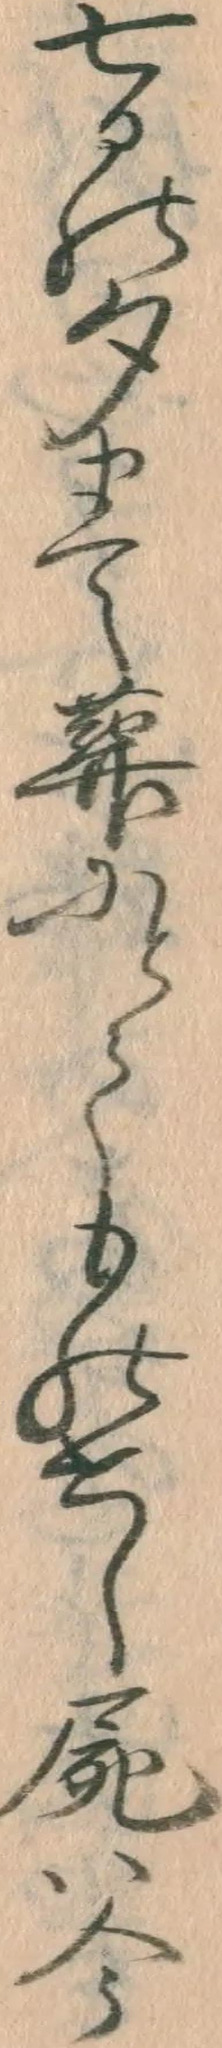七日の夕まて葬ふとてものせし屍ハ今
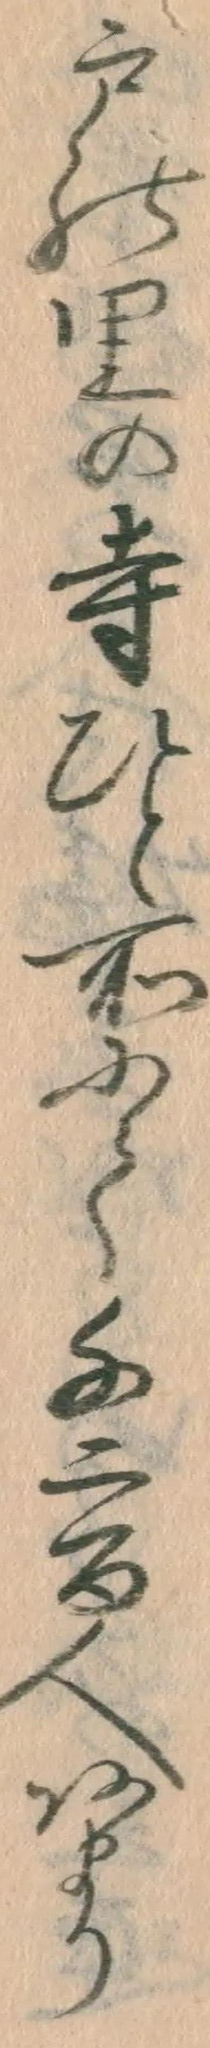この里の寺ひと所にて千二百人あまり
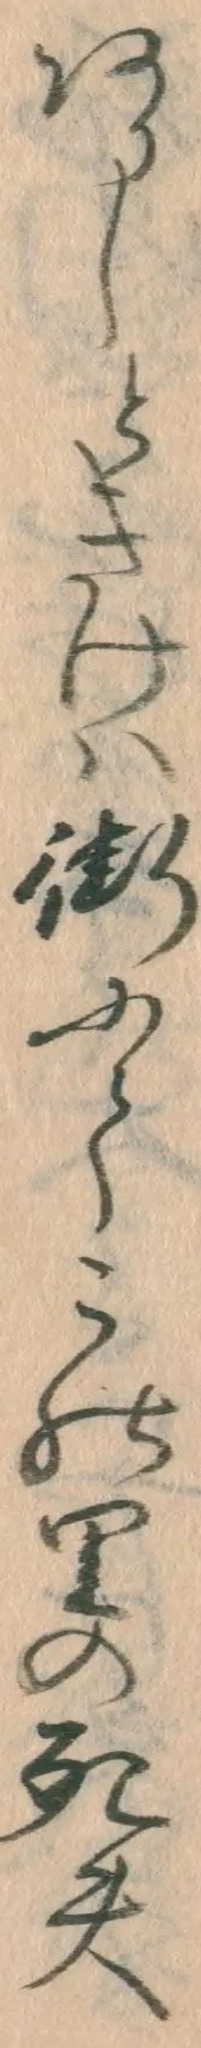ありしときけハ街にてこの里の死失
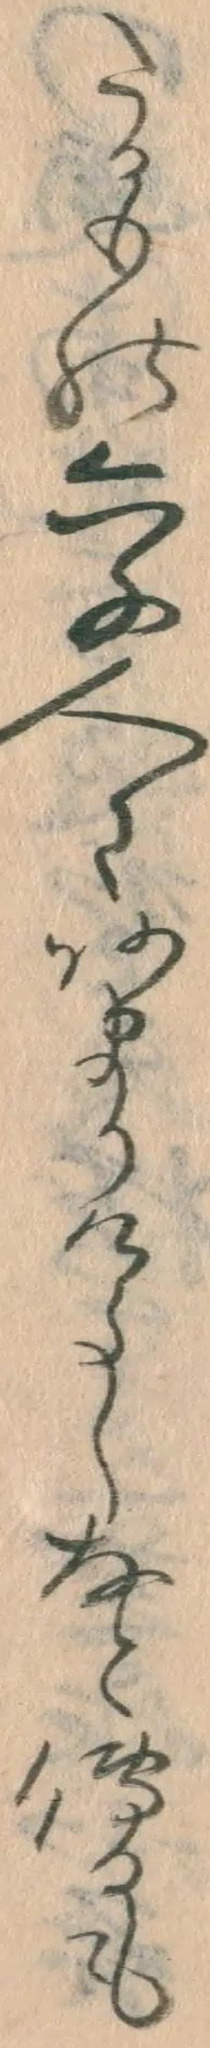たるもの六千人にあまりけるしなと傳るも
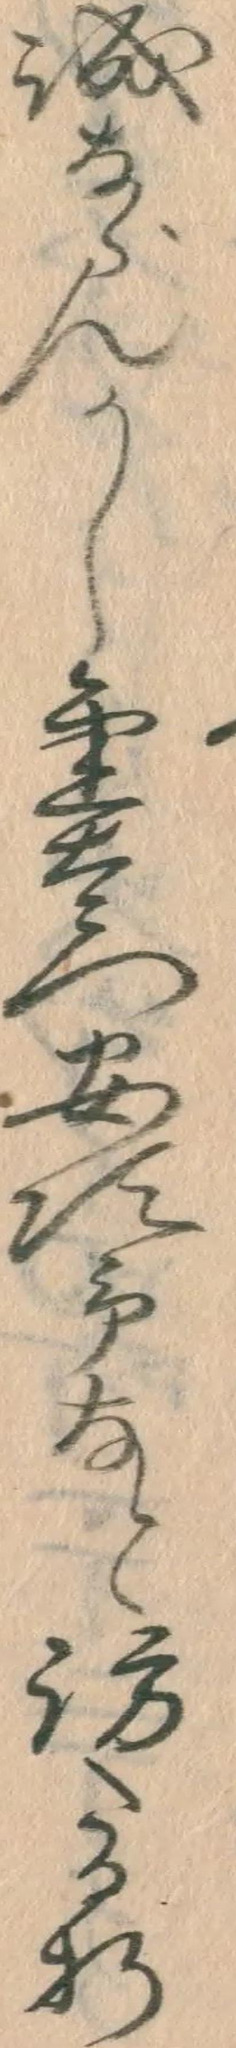誠ならんかし金右衛門安次郎なと訪たる折
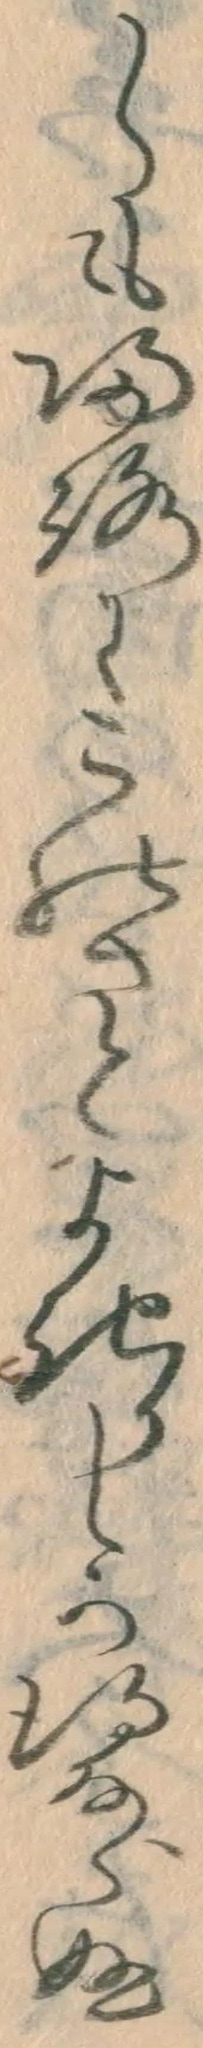しも帰路にこのさとよきりしか得ならぬ
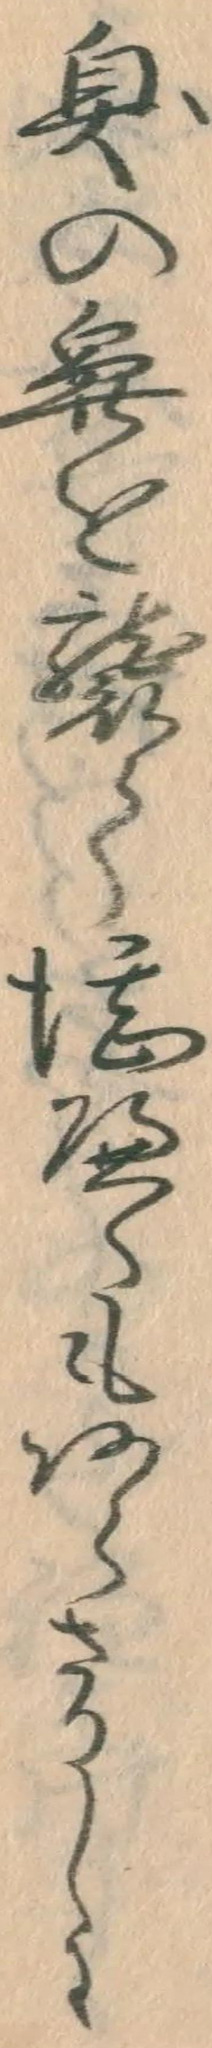臭の鼻を襲て堪へくもあらさりしに
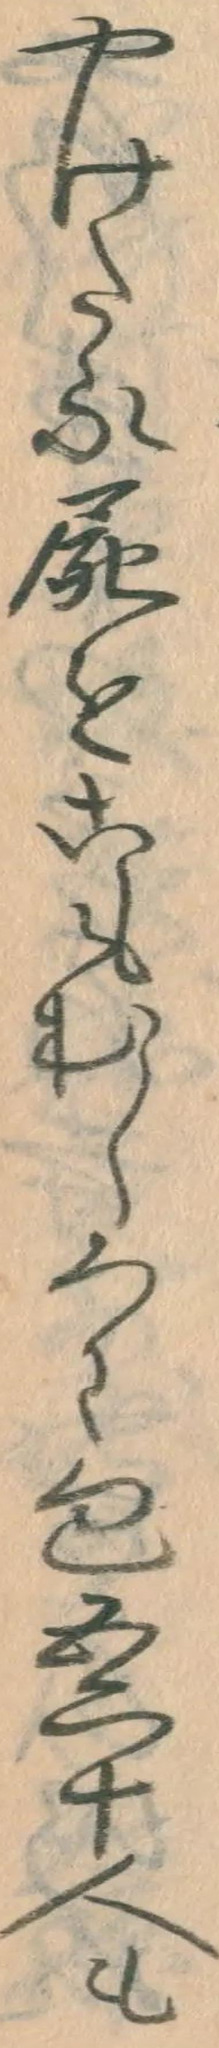やけたる屍をこもむしろに包五六十人も

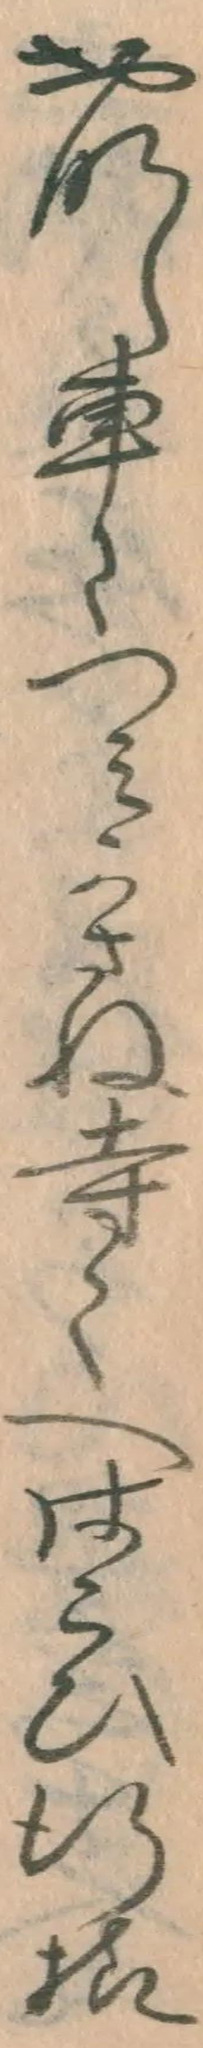おなし車につミかさね寺々へはこひ行様
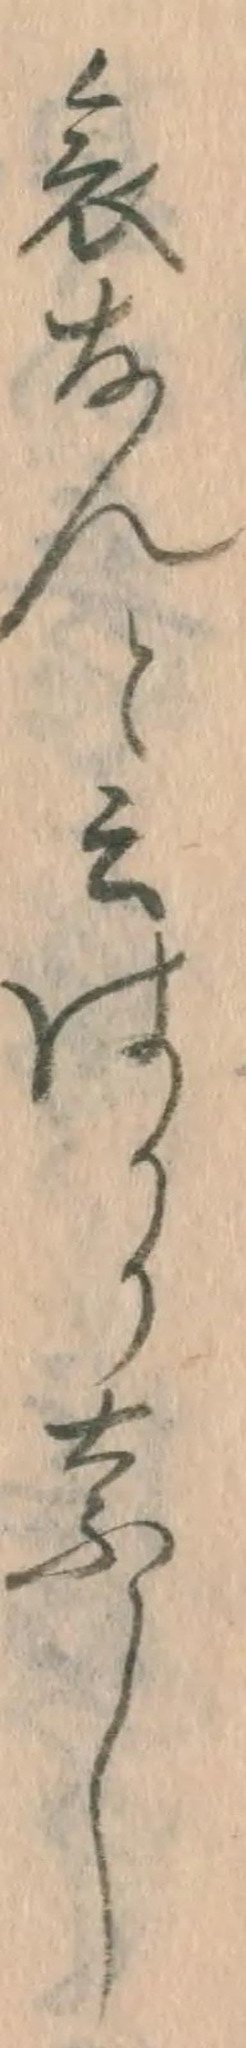哀なんと云はかりなし
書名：麗斎叢書. 20
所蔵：国立国会図書館 National Diet Library, JAPAN
